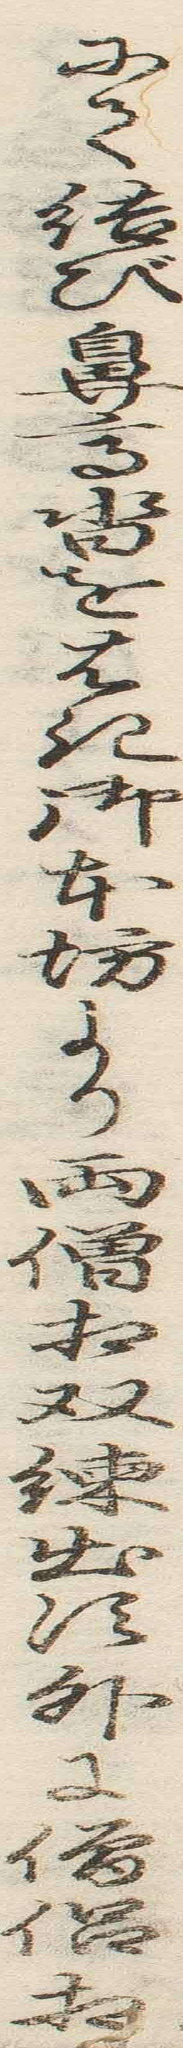にて結び鼻高沓をはき御本坊より両僧相双練出す外に僧侶相
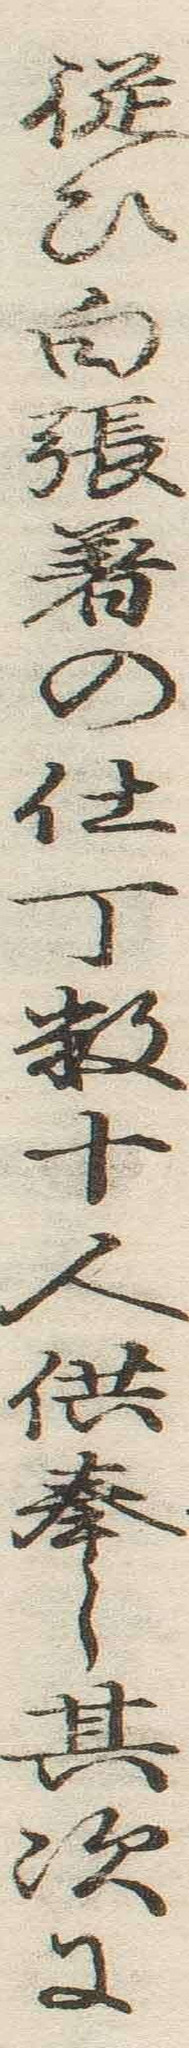従ひ白張着の仕丁数十人供奉し其次に
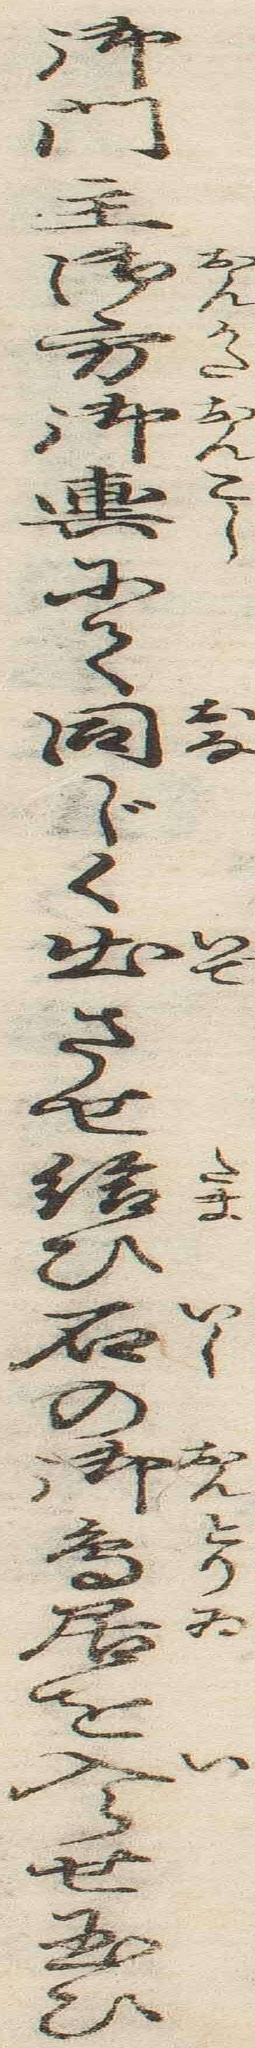御門主御方御輿にて同じく出させ給ひ石の御鳥居を入らせ玉ひ

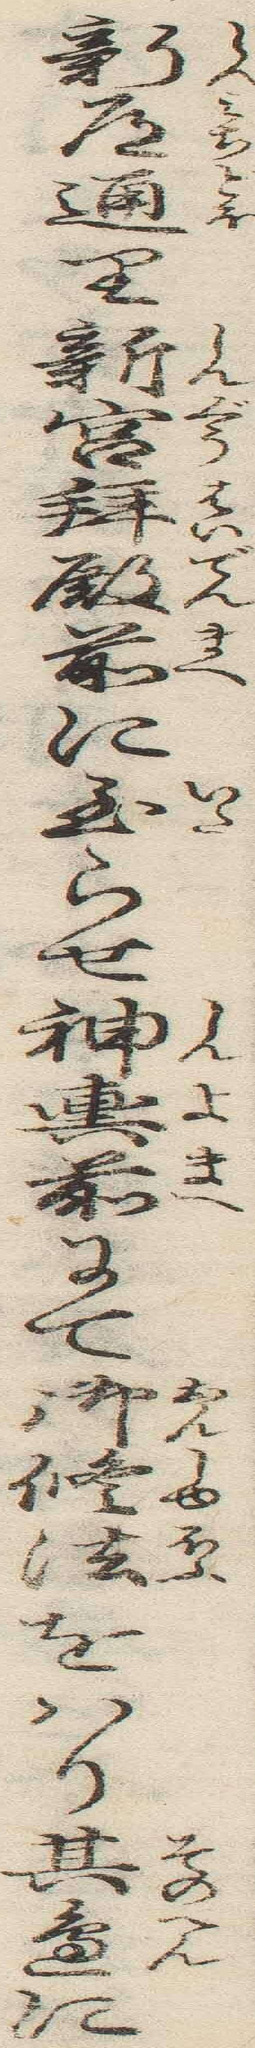新道通り新宮拜殿前に至らせ神輿前にて御修法をはり其邊に
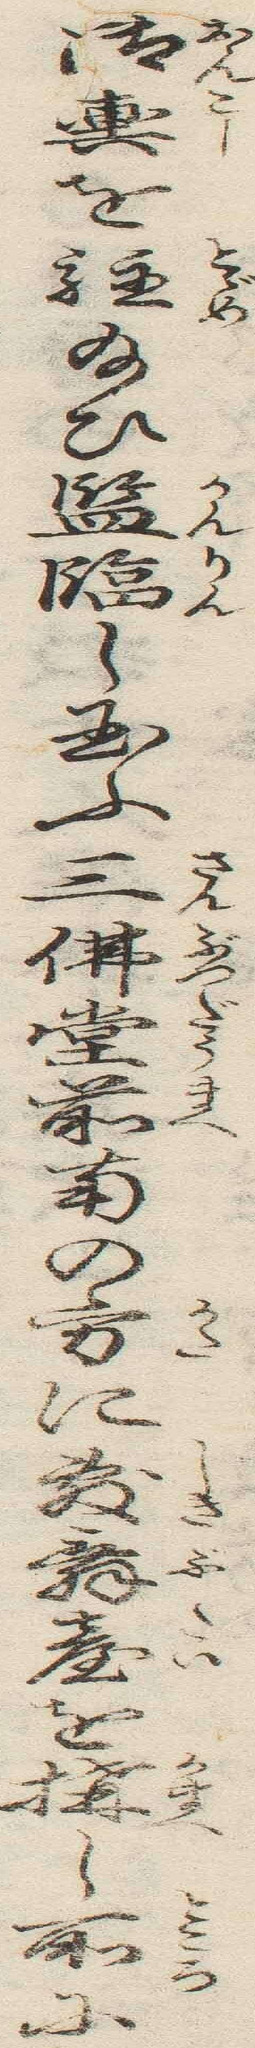御輿を駐給ひ監臨し玉ふ三佛堂前南の方に敷舞臺を搆し所に
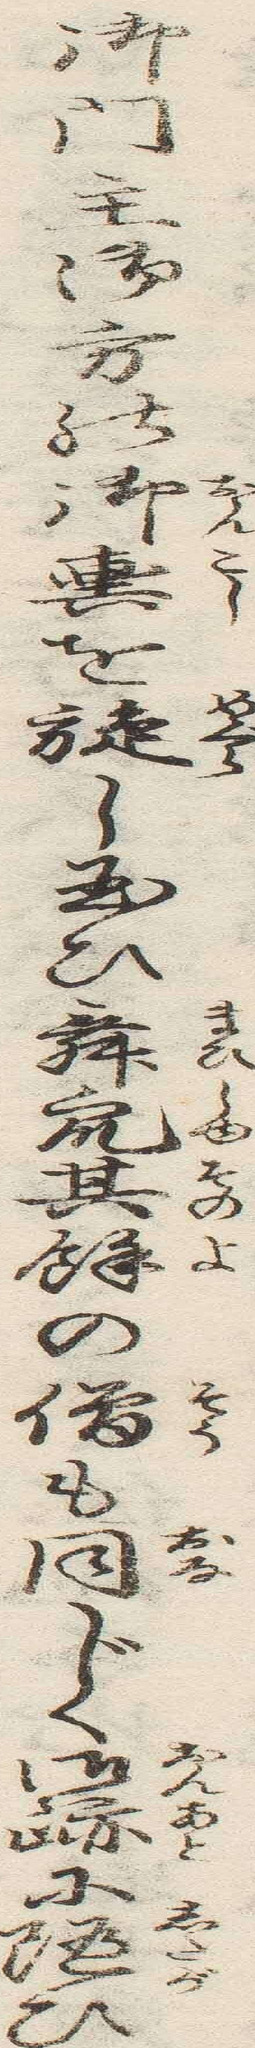御門主御方の御輿を旋し玉ひ舞衆其餘の僧も同じく御跡に随ひ
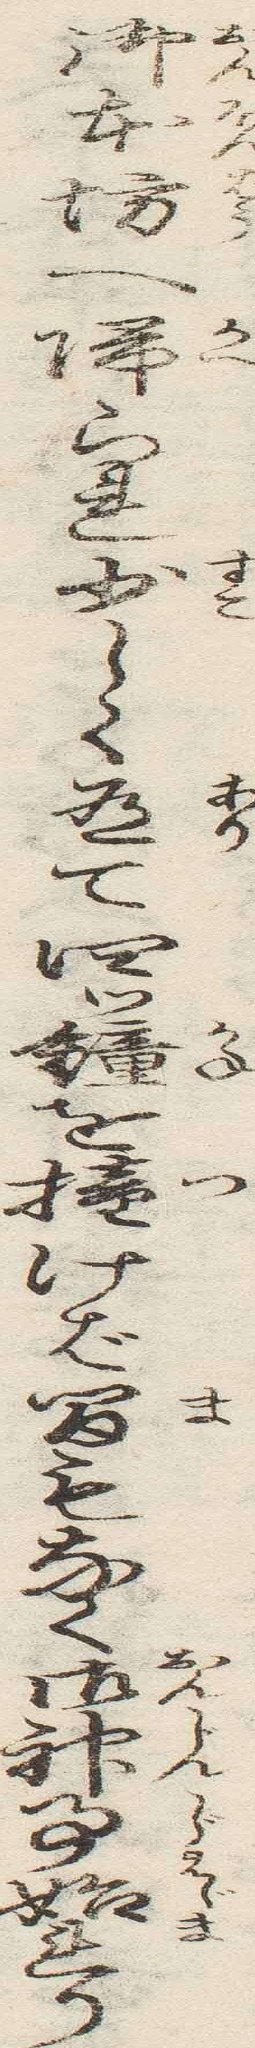御本坊へ帰られ少しく有て四ッ鐘を撞けば間もなく御神事始れり
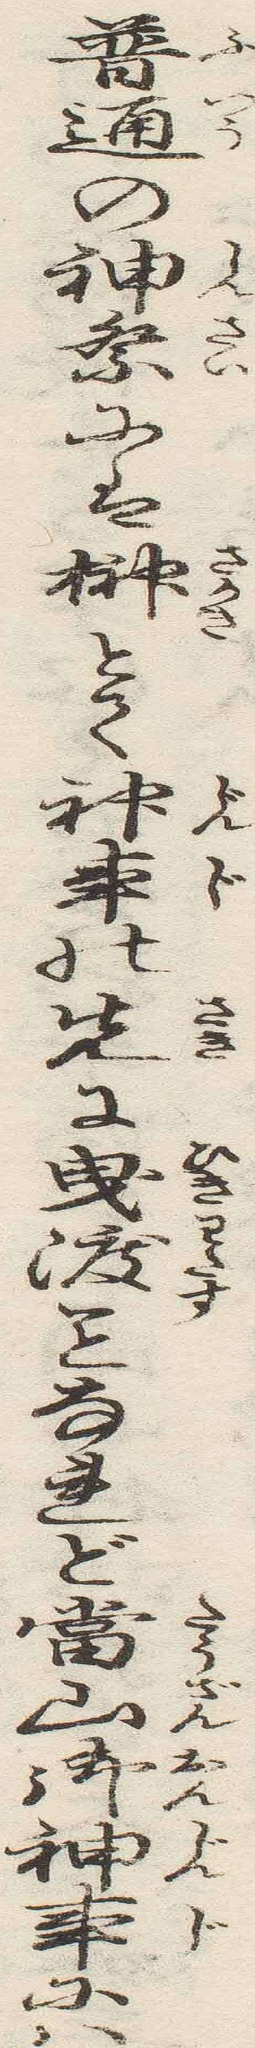普通の神祭には榊とて神事の先に曳渡ことなれど當山御神事には
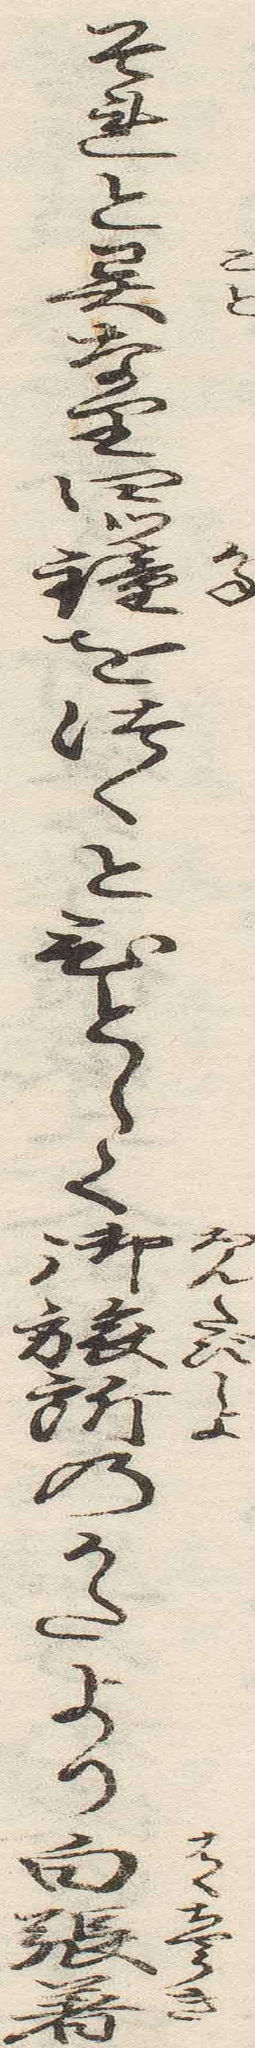それと異なり四ッ鐘をつくとひとしく御旅所のかたより白張着
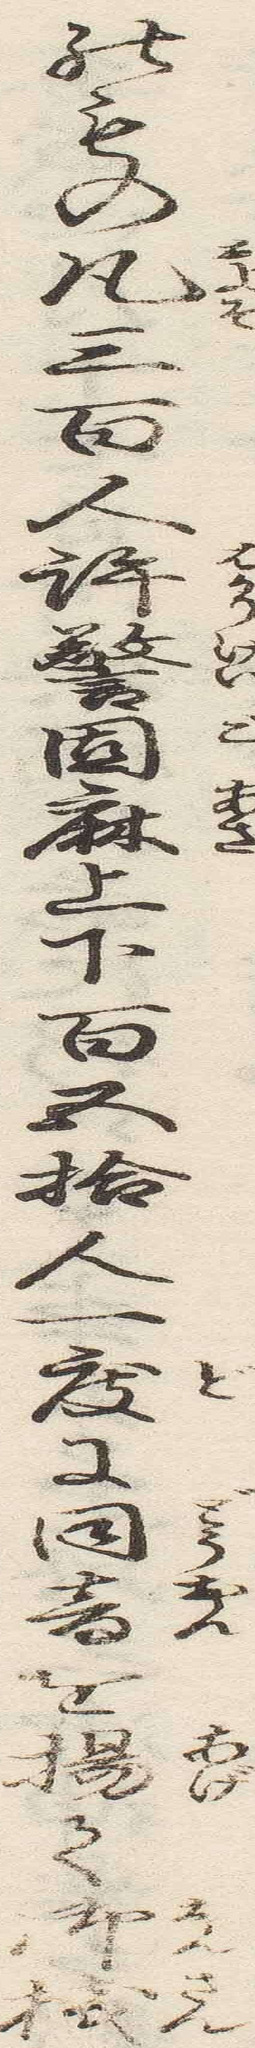のもの凡三百人許警固麻上下百五拾人一度に同音を揚て御桟
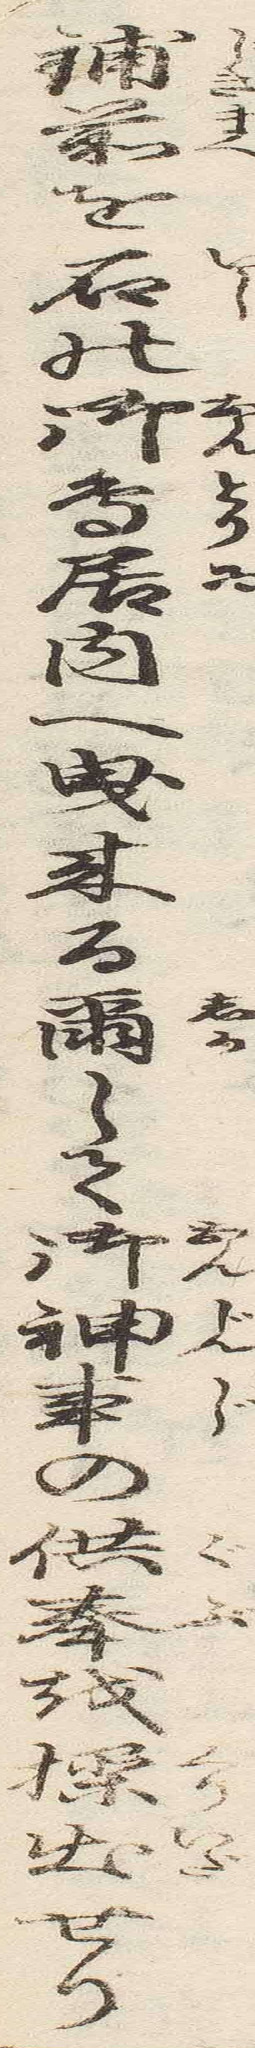敷前を石の御鳥居内へ曳來る爾して御神事の供奉を操出せり
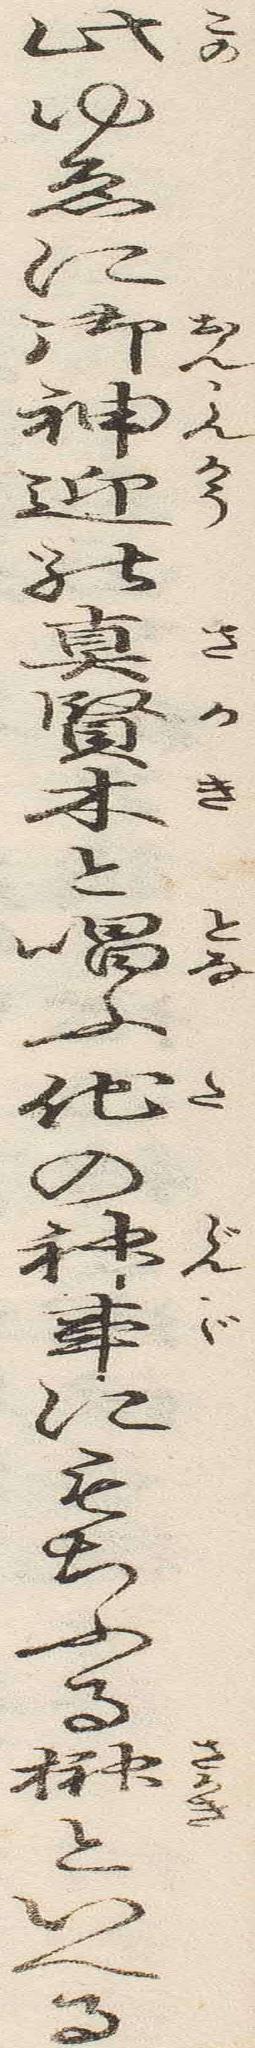此ゆゑに御神迎の真賢木と唱ふ他の神事にもちふる榊といへる
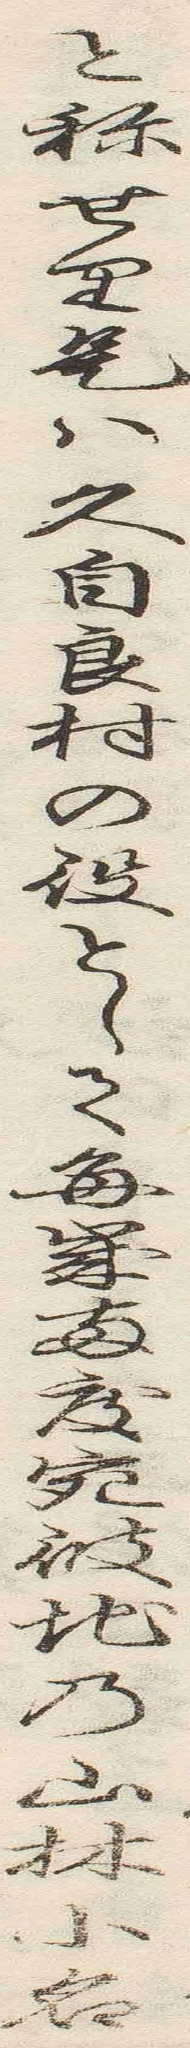と称せり是は久自良村の役として每歳両度宛彼地の山林小名
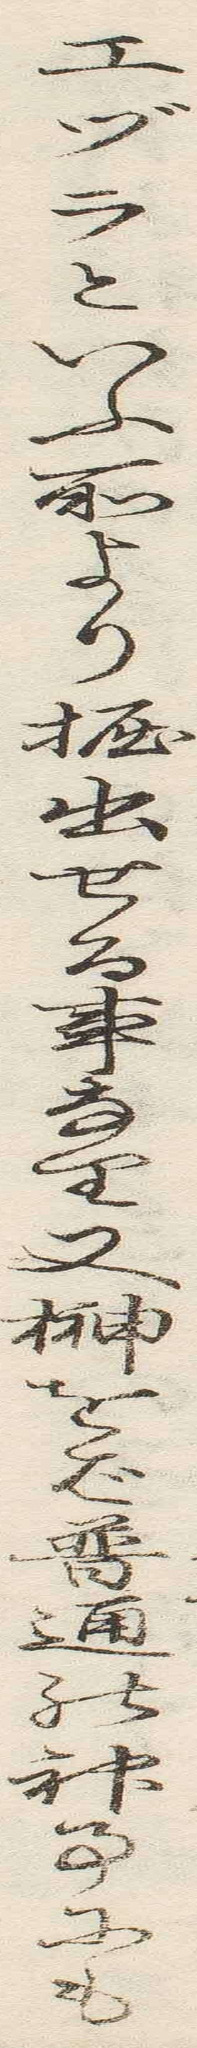エヅラといふ所より堀出せる事なり又榊をば普通の神事にも
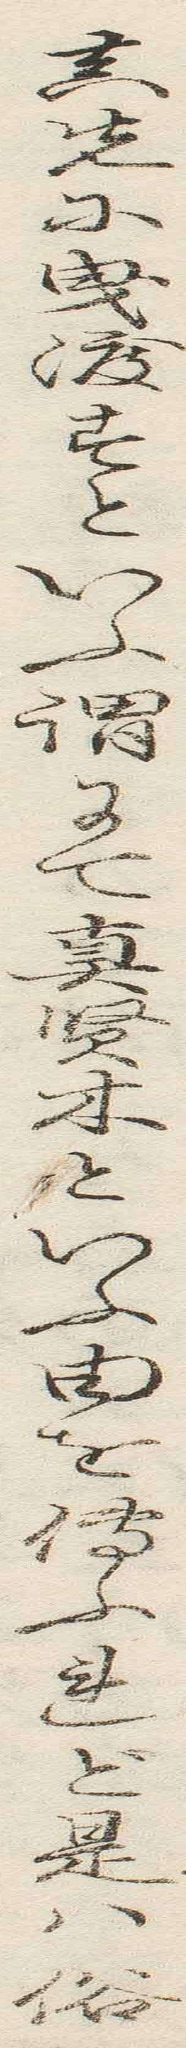真先に曳渡すといふ謂にて真賢木といふ由を傳ふれど是は俗
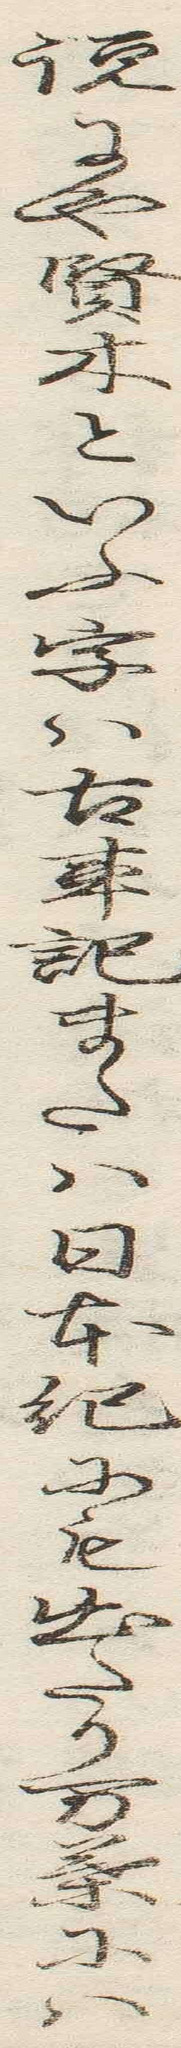説にや賢木といふ字は古事記または日本紀にも出たり万葉には
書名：日光山志
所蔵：東京学芸大学附属図書館 国文学研究資料館
